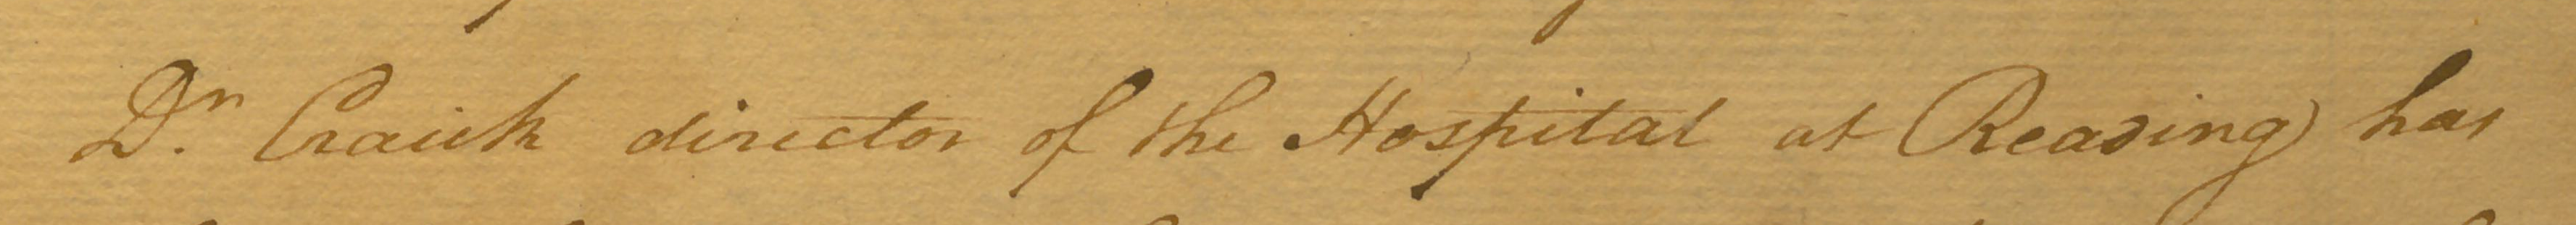D^r. Craick director of the Hospital at Reading has
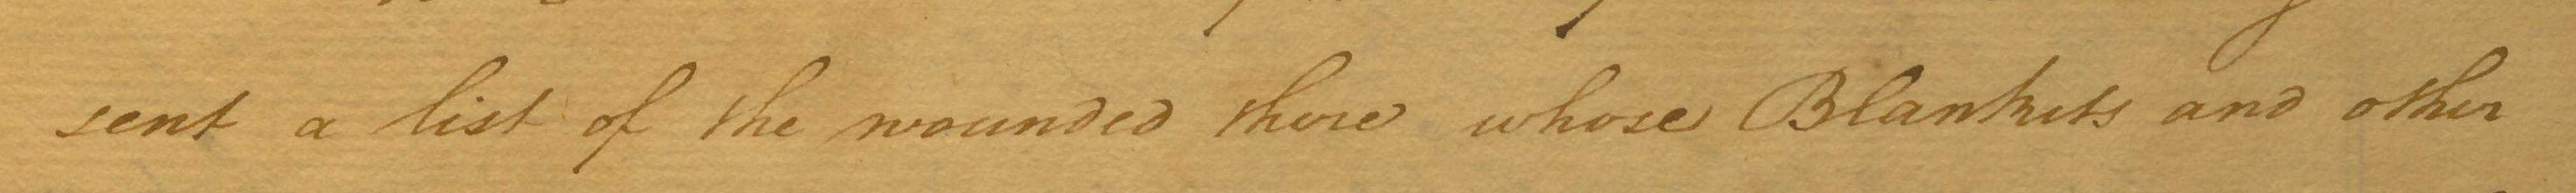sent a list of the wounded there whose Blankets and other
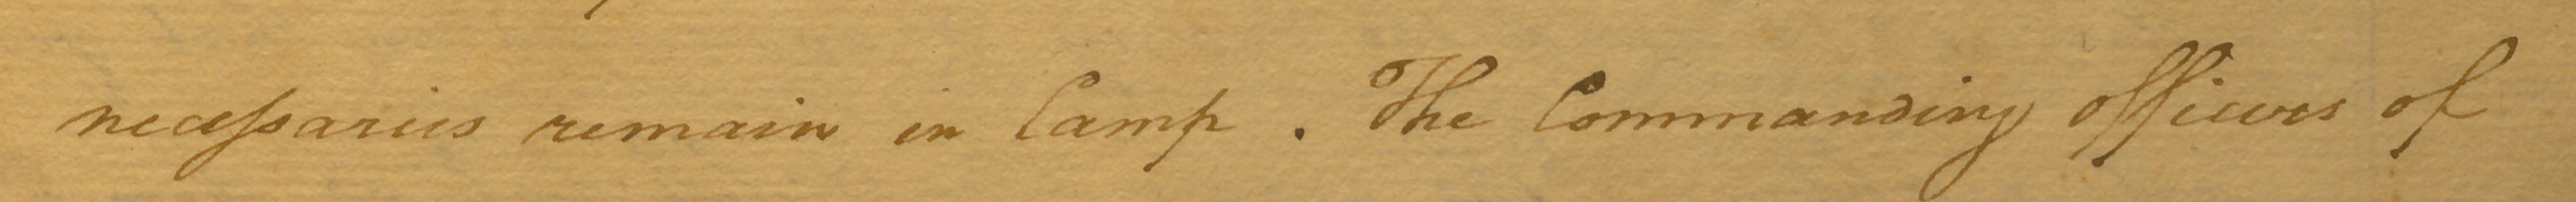necessaries remain in Camp. The Commanding officers of
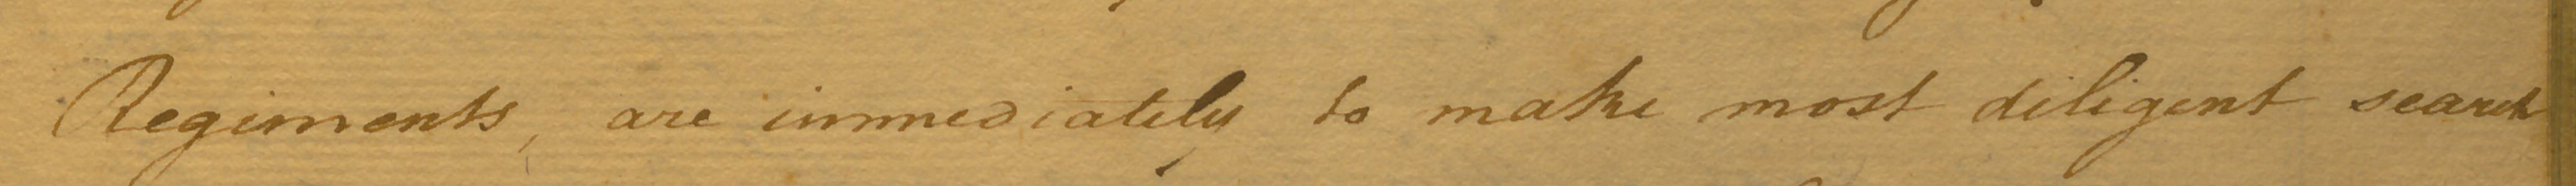Regiments are immediately to make most diligent search
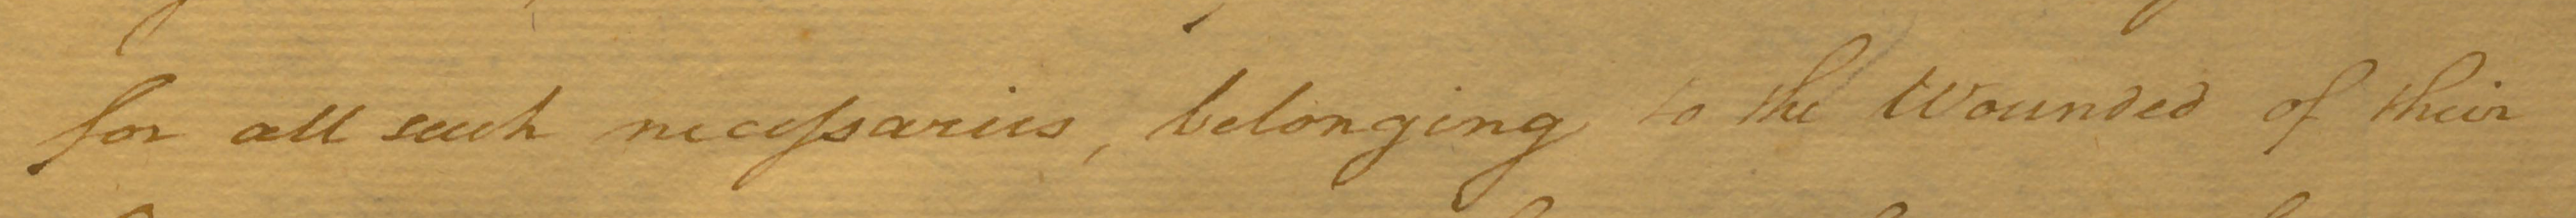for all such necessaries belonging to the Wounded of their
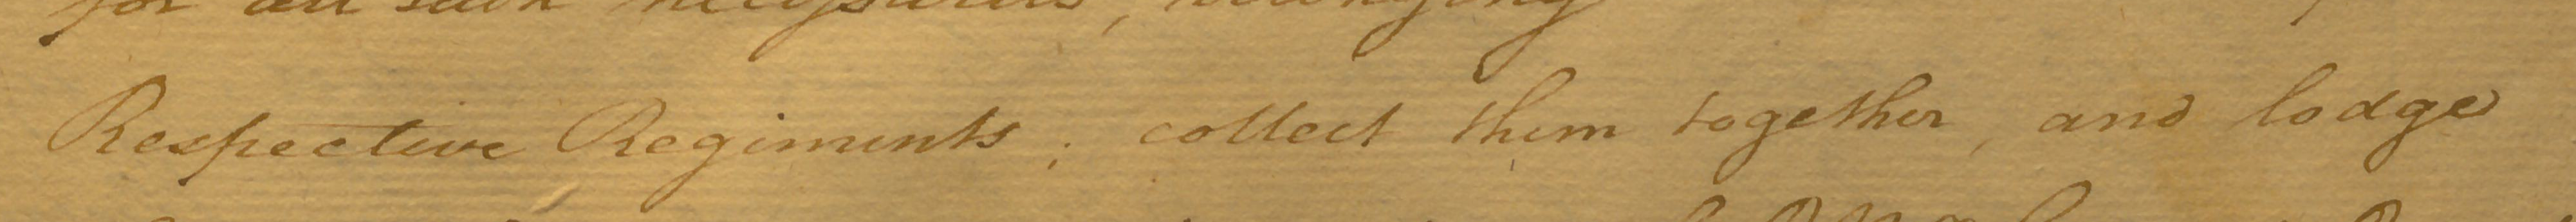Respective Regiments; collect them together, and lodge
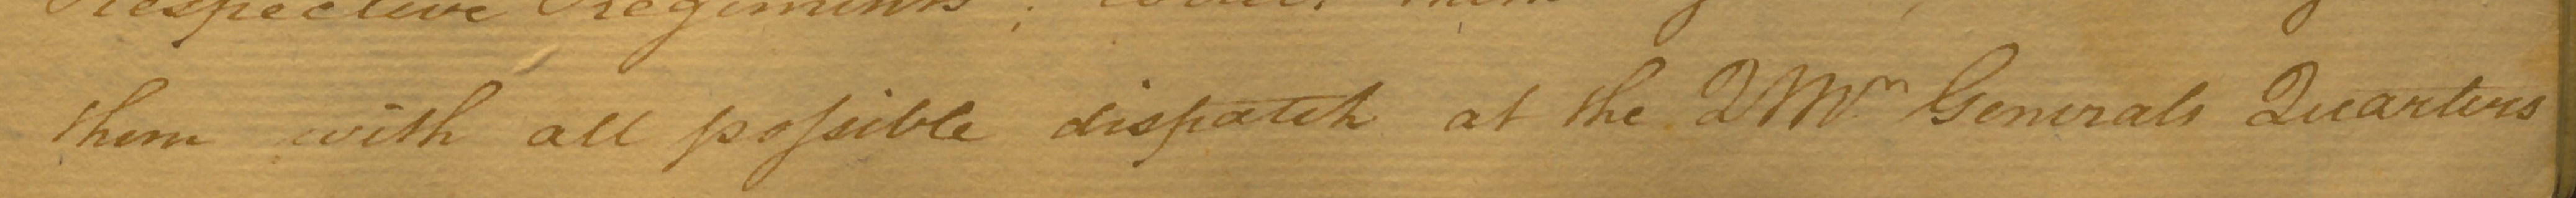them with all possible dispatch at the QM^r Generals Quarters
